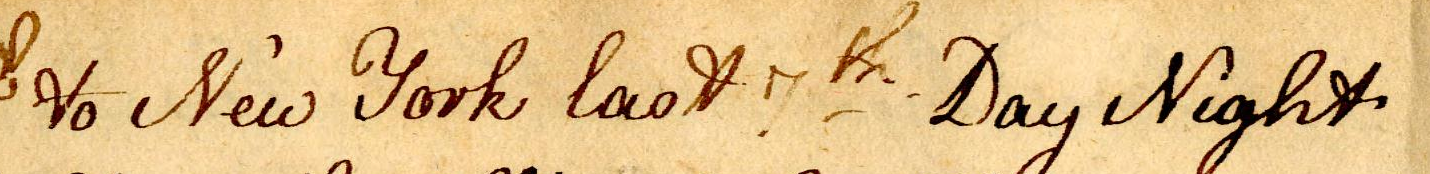to New York last 7^th Day Night
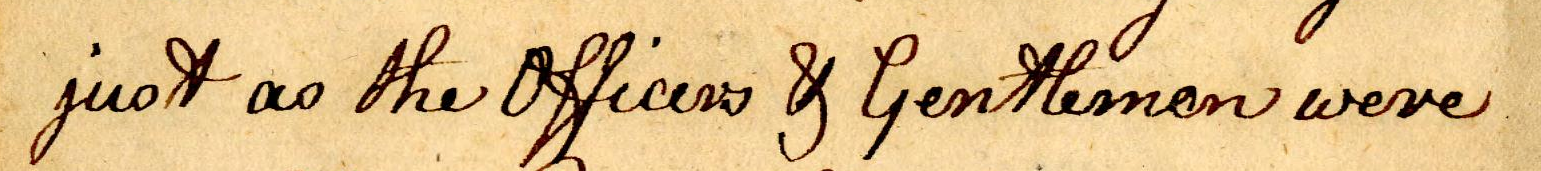just as the Officers & Gentlemen were
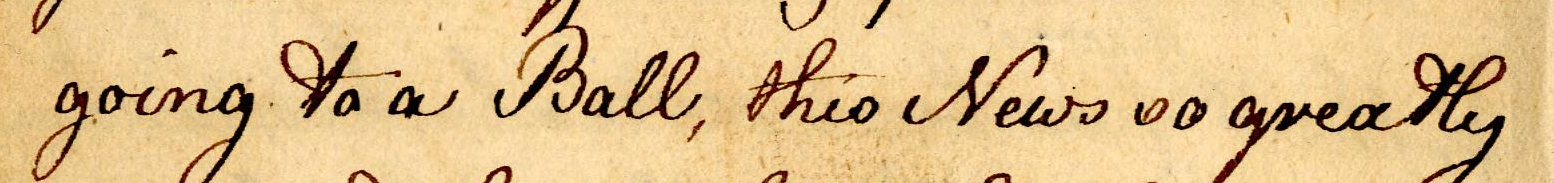going to a Ball, this News so greatly
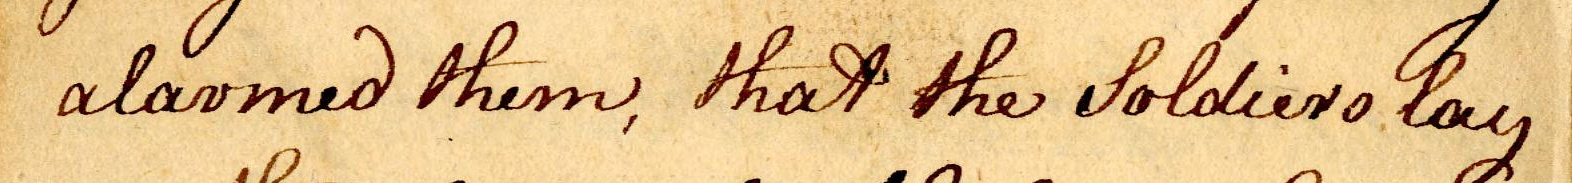alarmed them, that the Soldiers lay
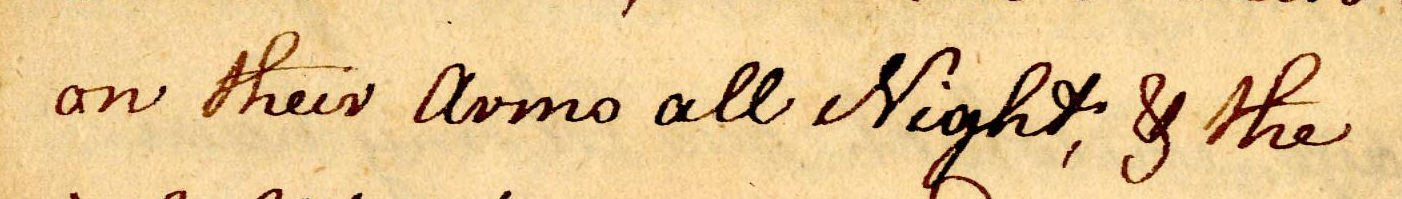on their Arms all Night, & the
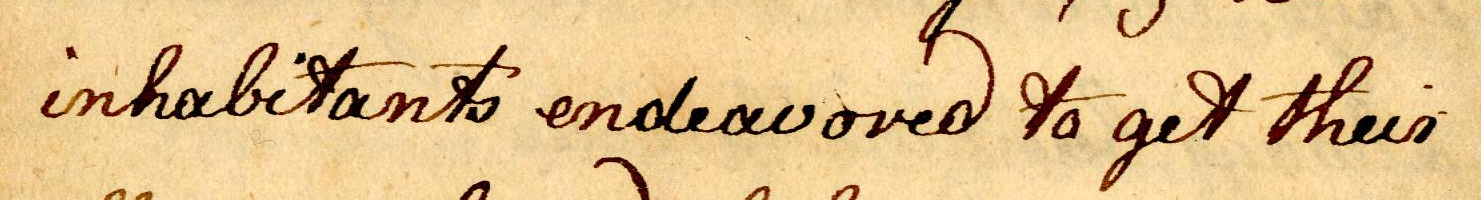inhabitants endeavored to get their
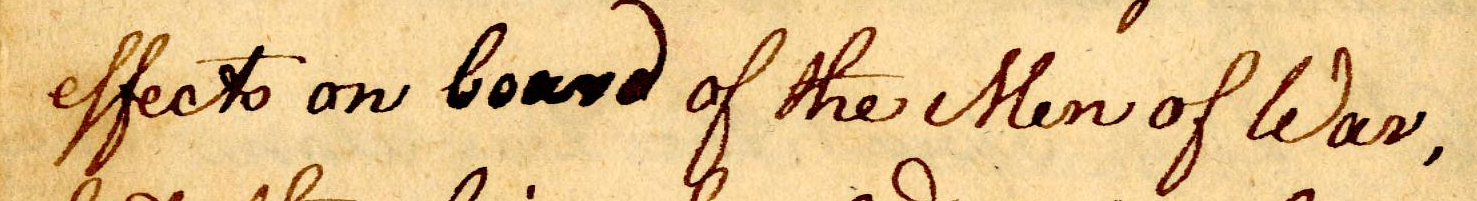effects on board of the Men of War,
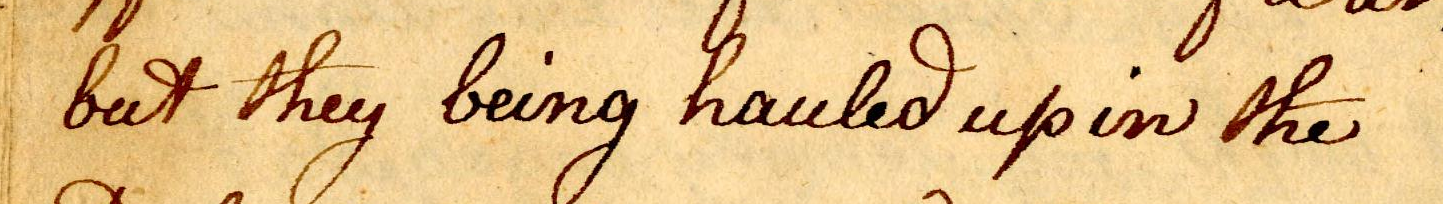but they being hauled up in the
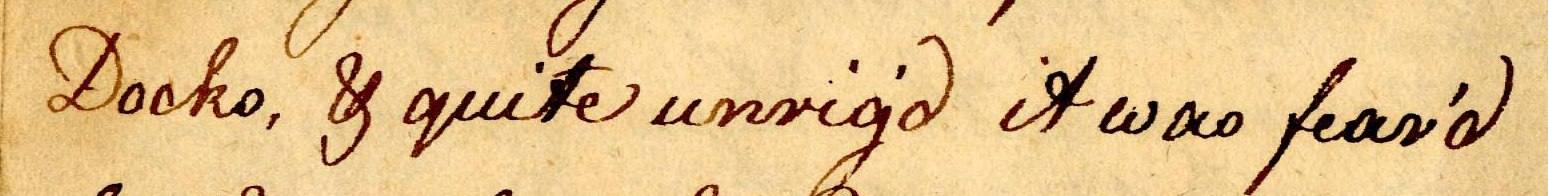Docks, & quite unrig'd it was fear'd
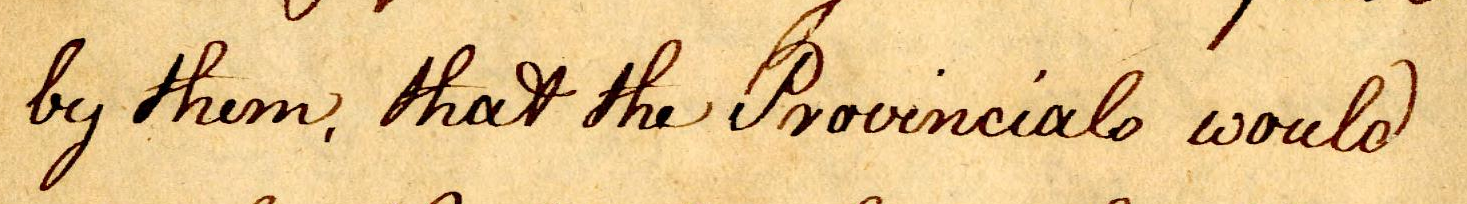by them, that the Provincials would
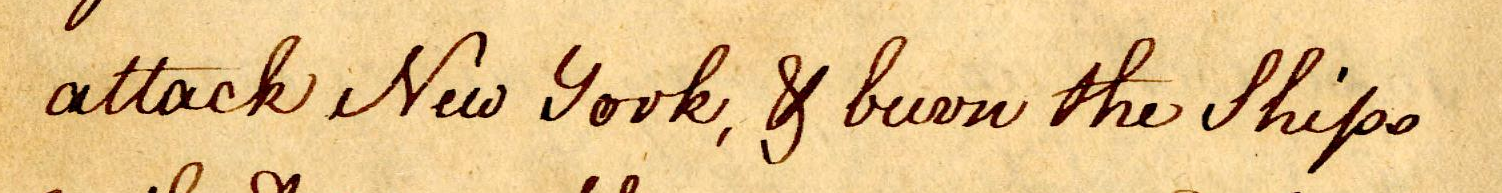attack New York, & burn the Ships
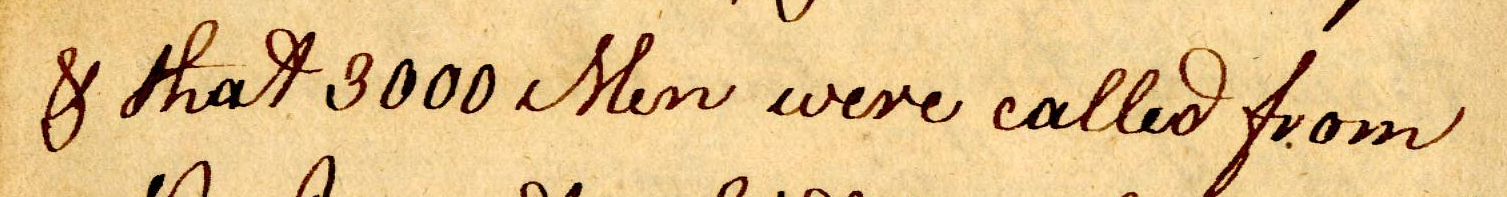& that 3000 Men were called from
